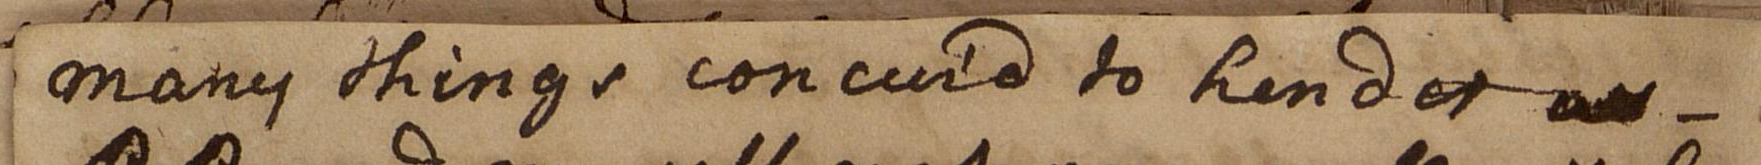many things concur'd to hinder us-
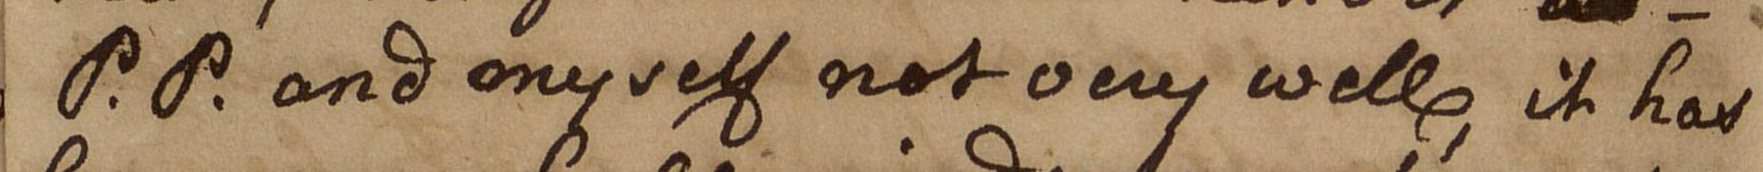P. P. and myself not very well, it has
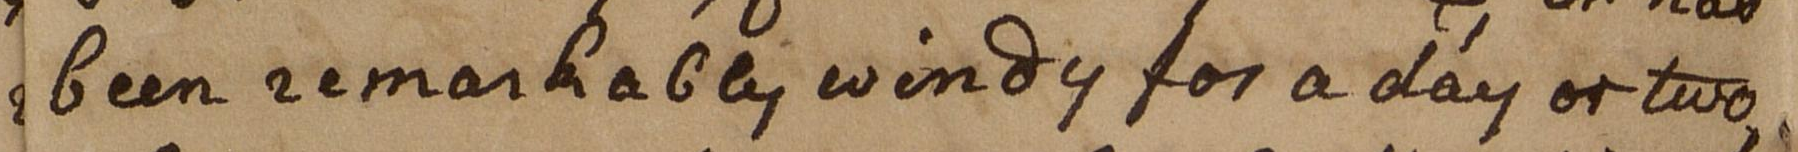been remarkably windy for a day or two,
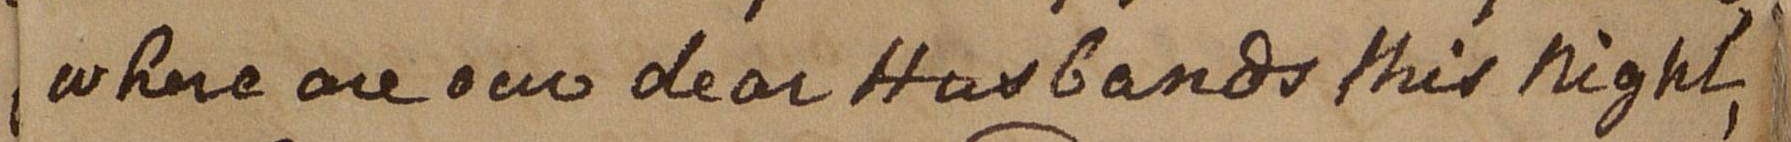where are our dear Husbands this Night,
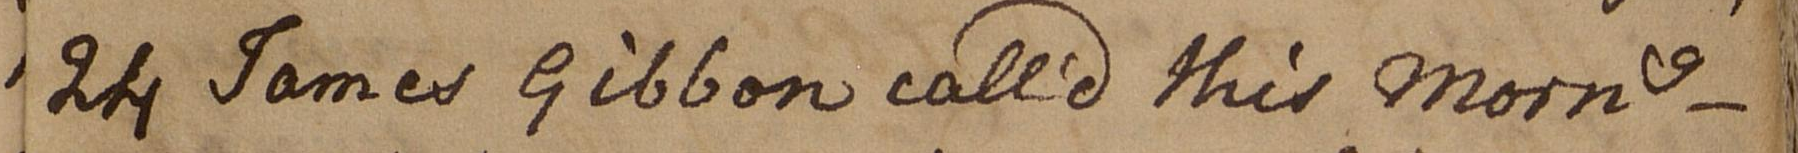24 James Gibbon call'd this morn^g-
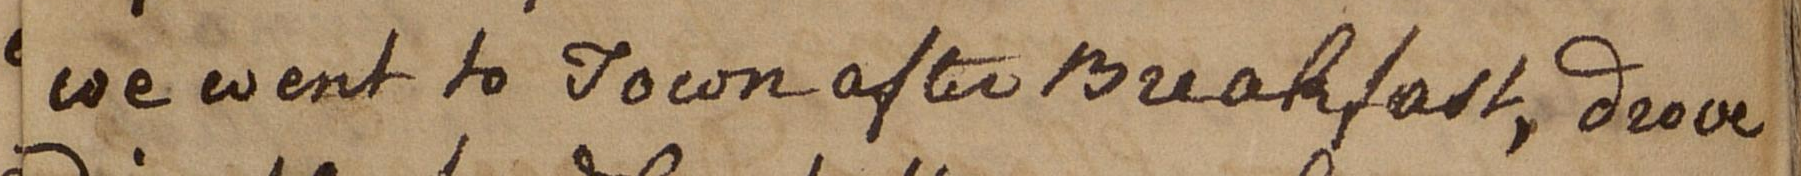we went to Town after Breakfast, drove
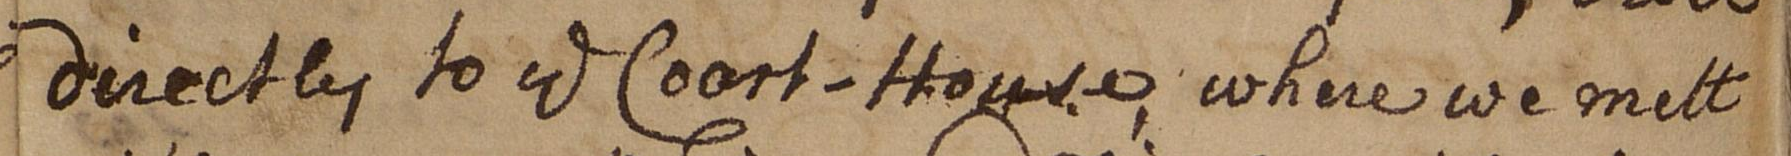directly to y^e Coart-House, where we mett
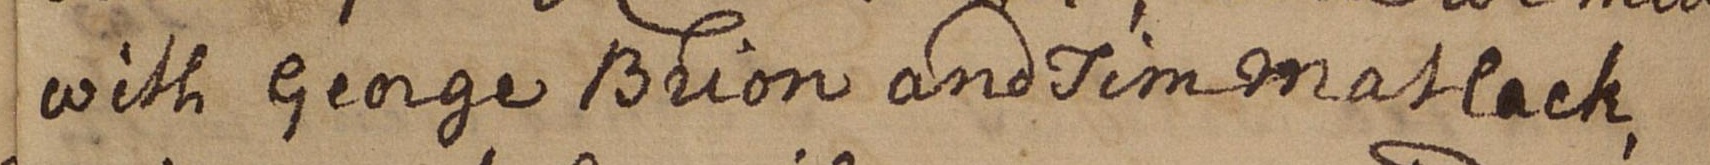with George Brion and Tim Matlack,
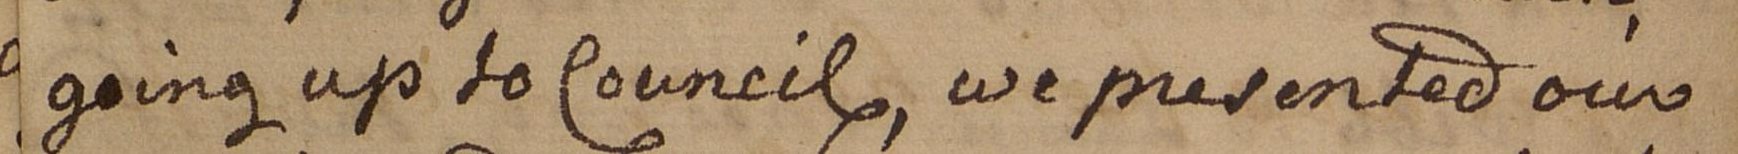going up to Council, we presented our
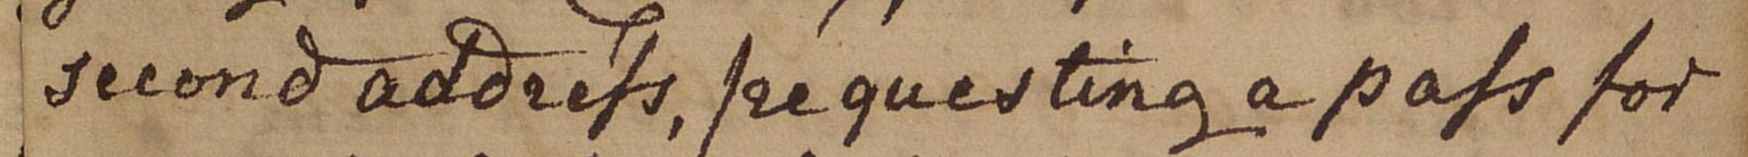second address, /requesting a pass for
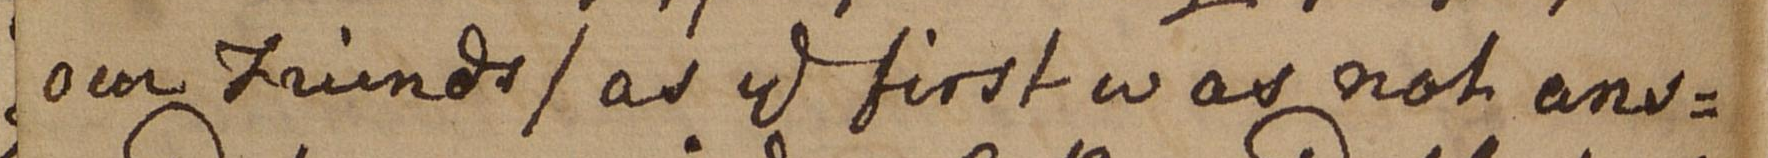our Friends/ as y^e first was not ans-
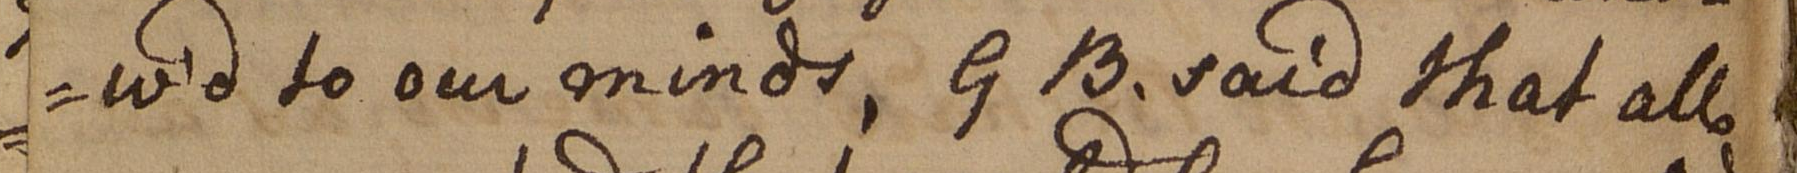-w'd to our minds, G B. said that all
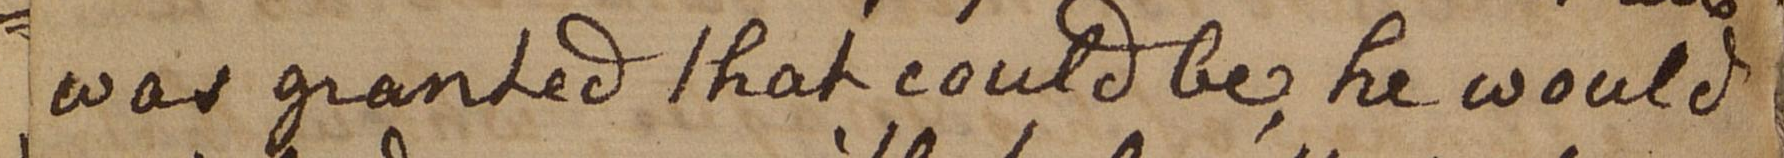was granted that could be, he would
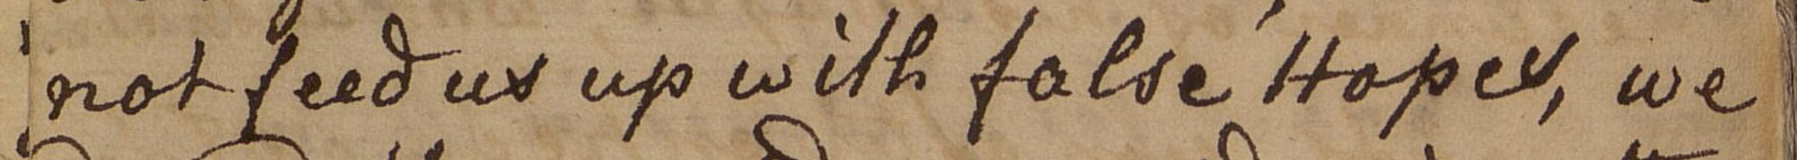not feed us up with false Hopes, we
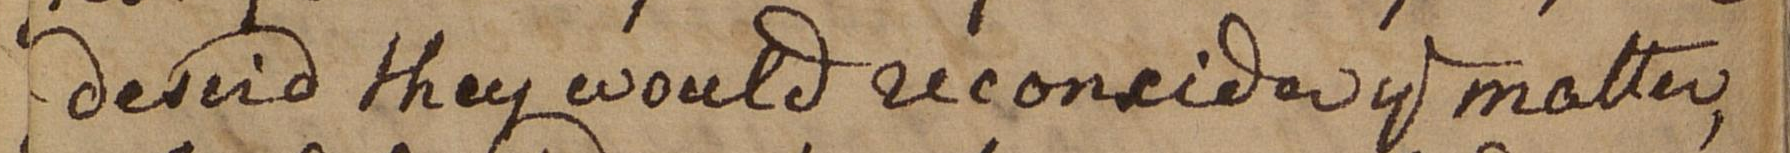-desir'd they would reconcider y^e matter,
